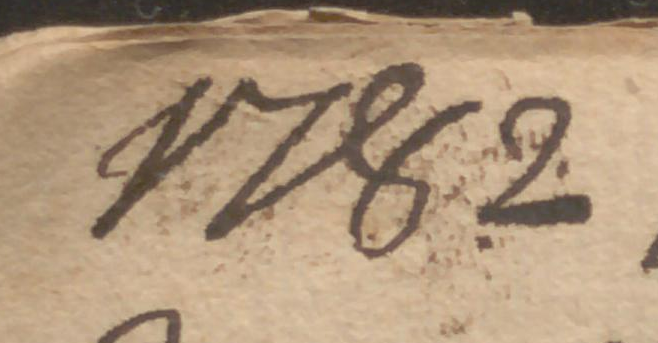1782
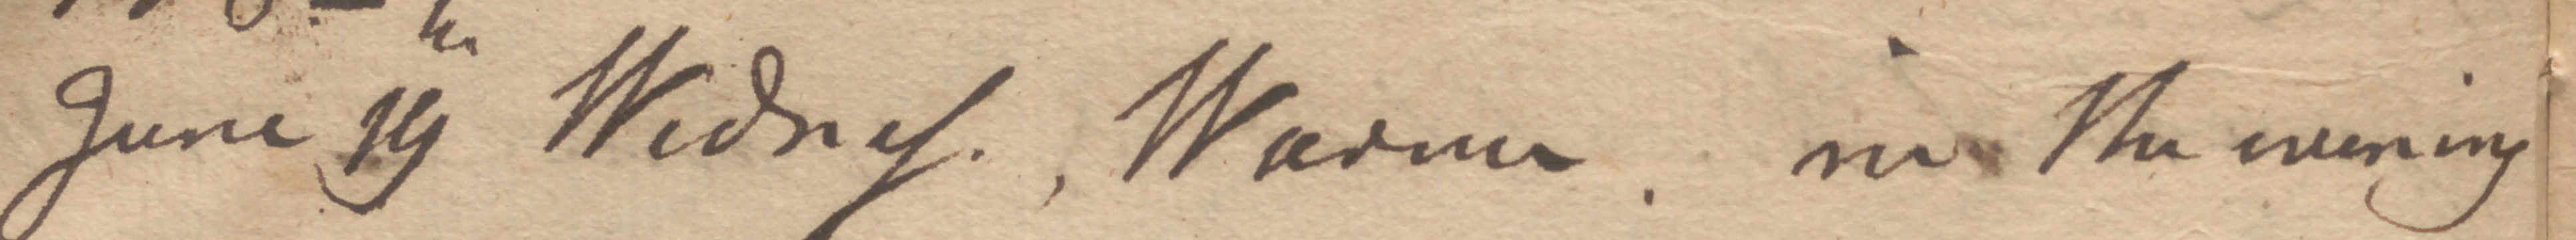June 19^th Wednes., Warme in the evening
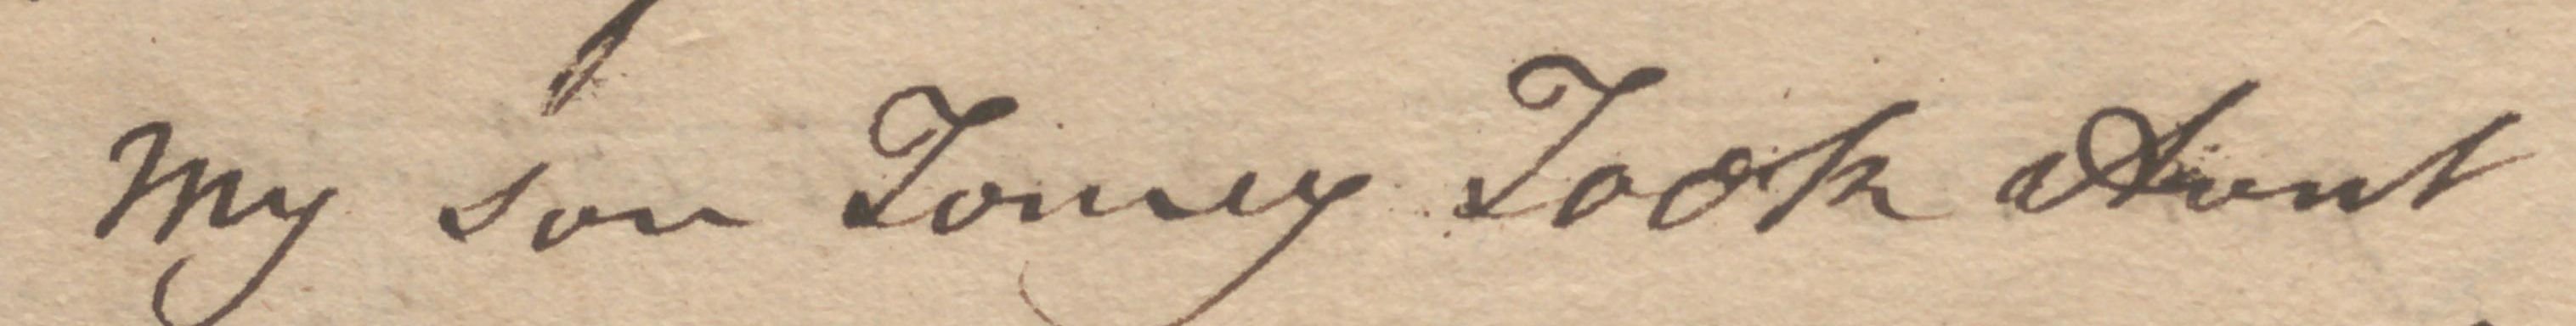My son Tomey Took Aunt
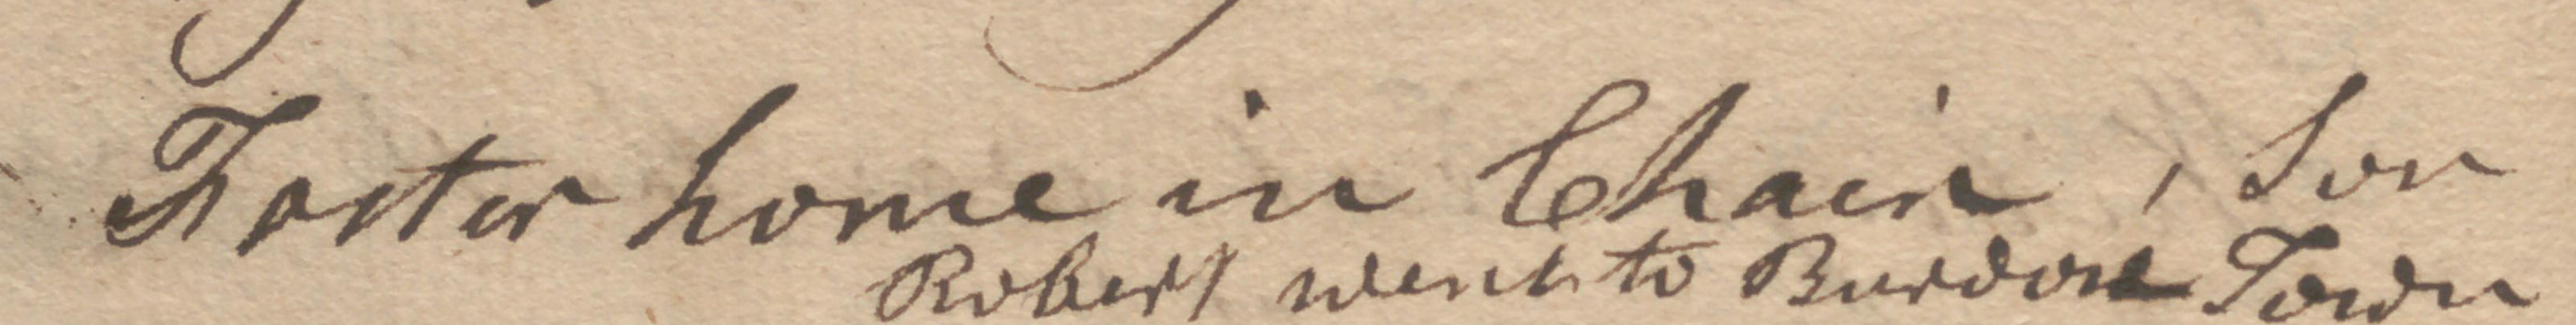Foster home in Chair, Son
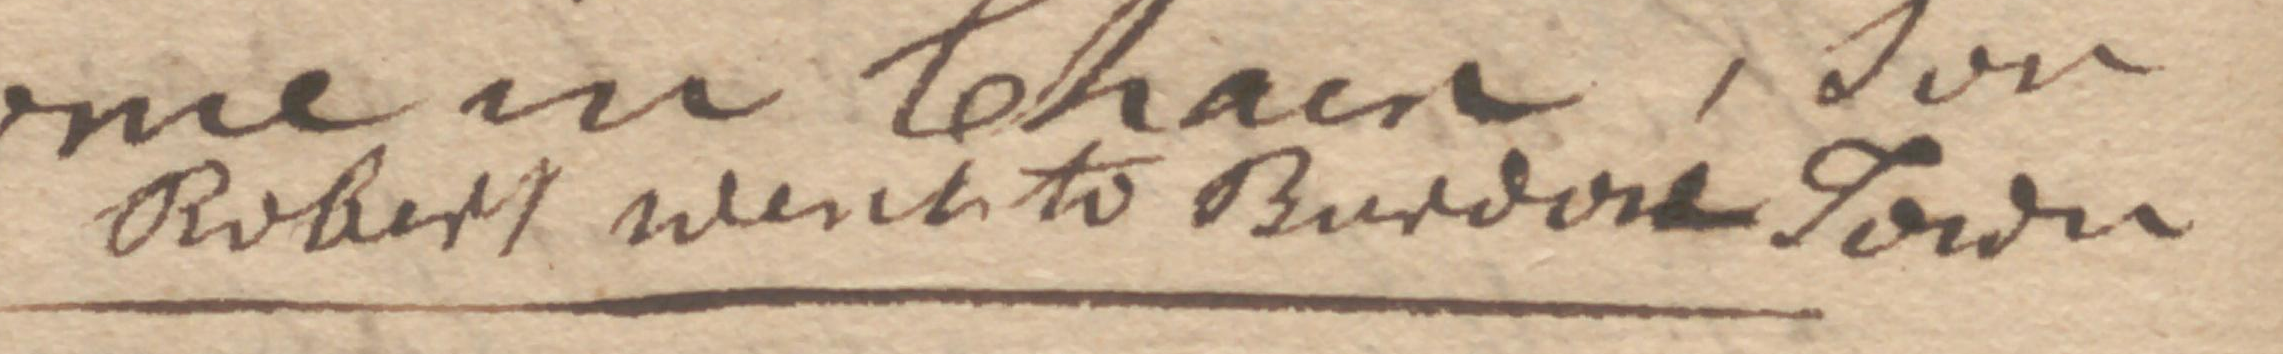Robert went to Burdon Town
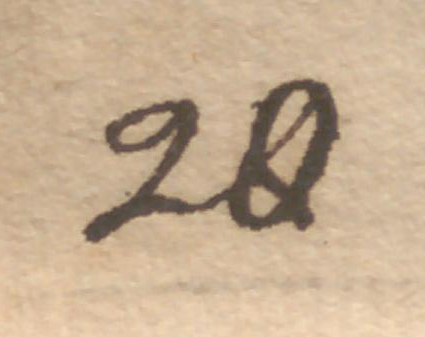20
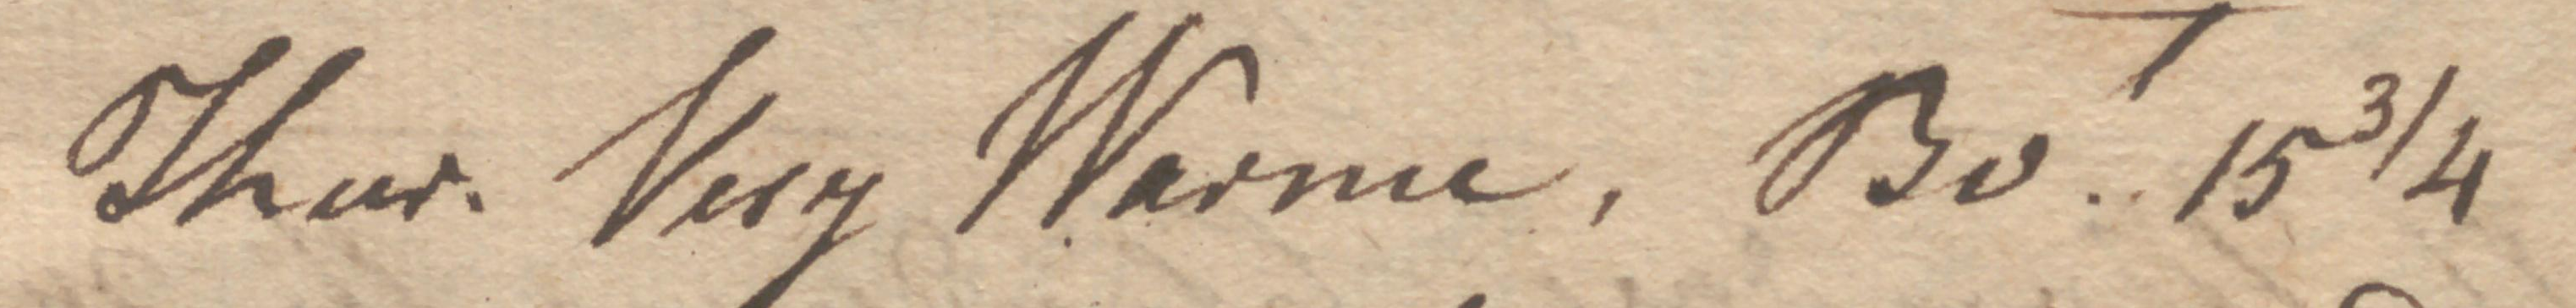Thur Very Warme, Bo^t. 15 3/4
